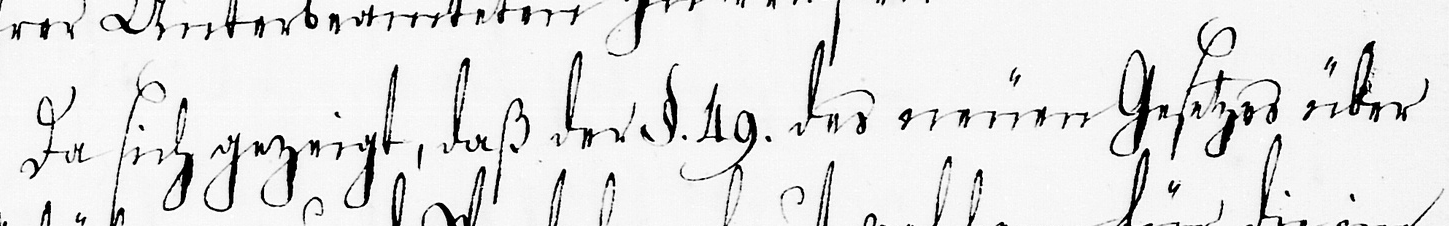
Da sich gezeigt, daß der §. 49. des neuen Gesetzes über
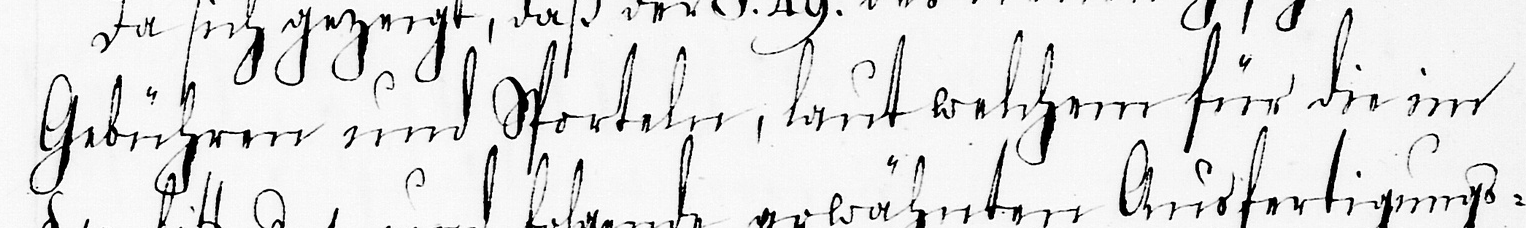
Gebühren und Sporteln, laut welchem für die im
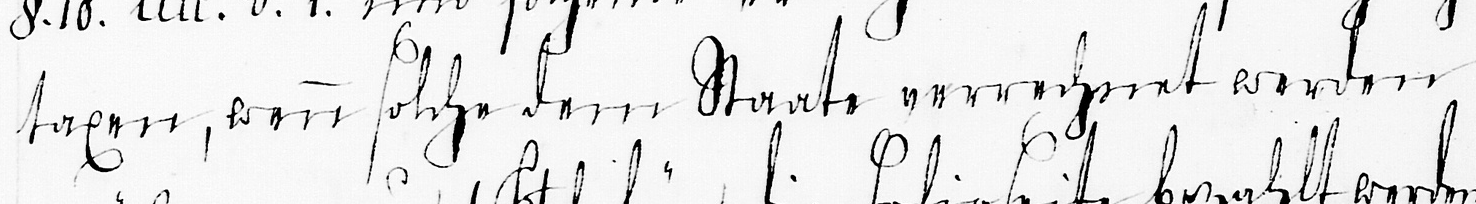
taxen, wenn solche dem Staate verrechnet werden
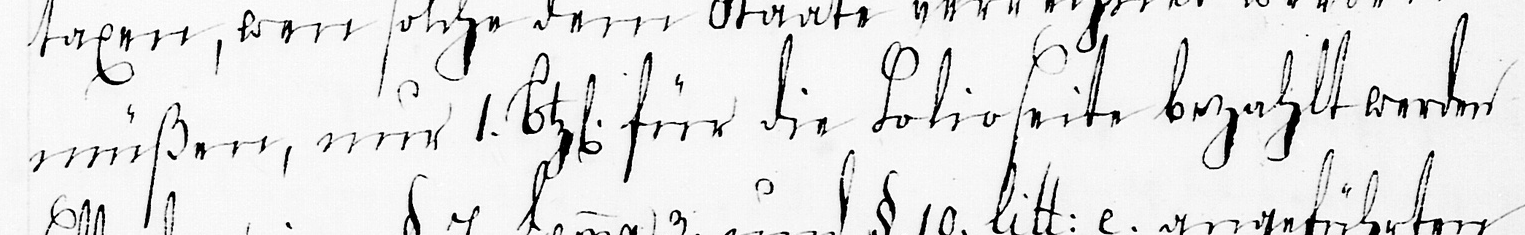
müßen, nur 1. Btz[en]. für die Folioseite bezahlt werden
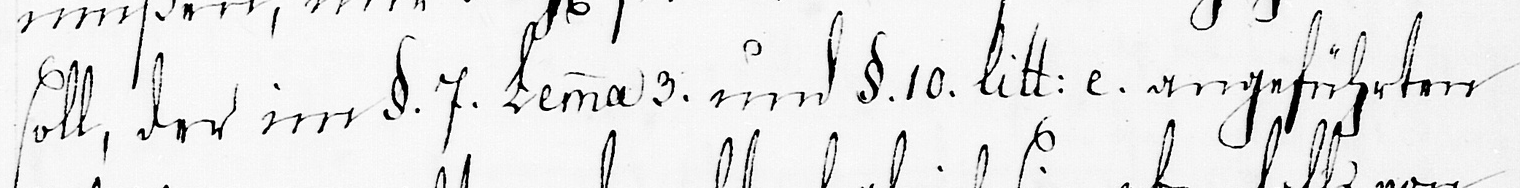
soll, der im §. 7. Lemma 3. und §. 10. litt: e. angeführten
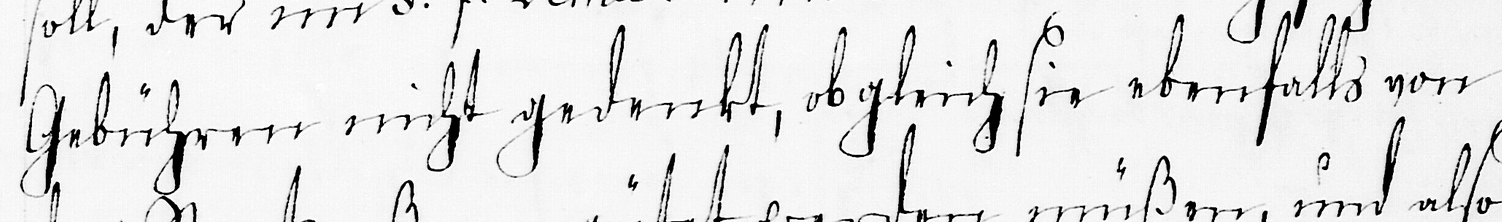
Gebühren nicht gedenkt, obgleich sie ebenfalls von
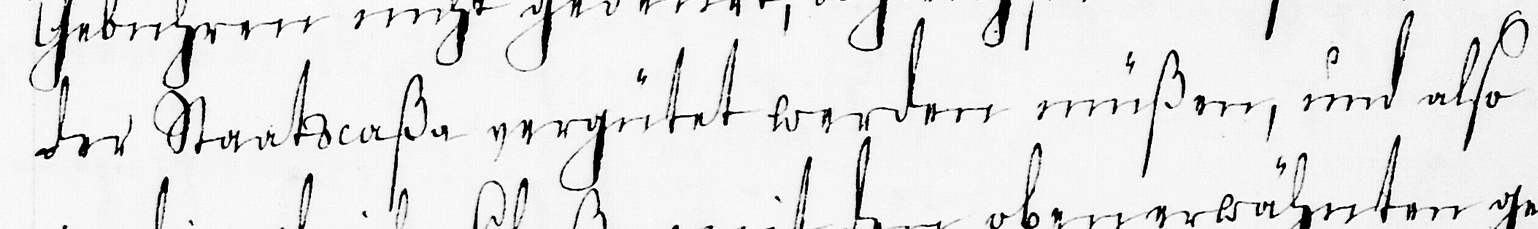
der Staatscaßa vergütet werden müßen, und also
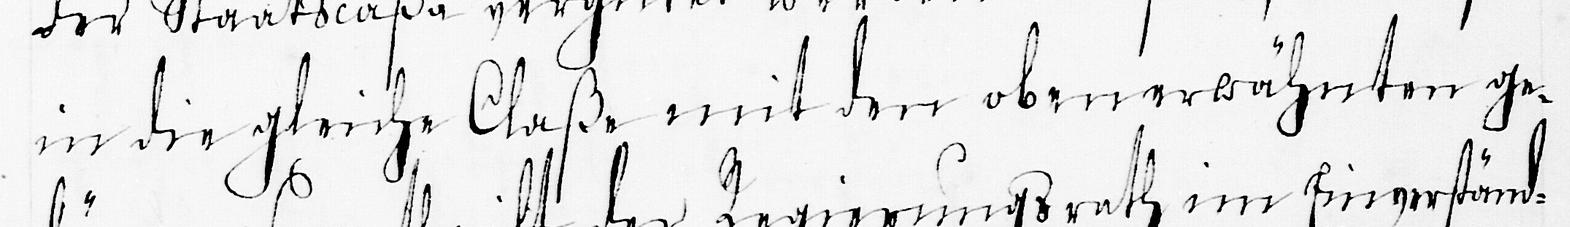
in die gleiche Claße mit den oben erwähnten ge¬
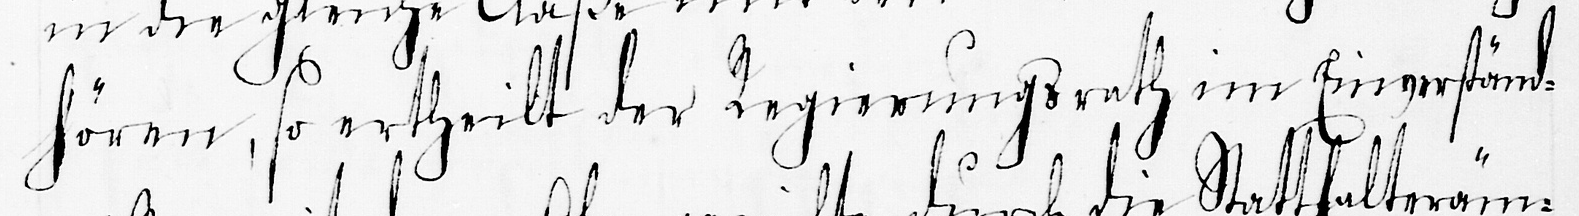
hören, so ertheilt der Regierungsrath im Einverständ¬
